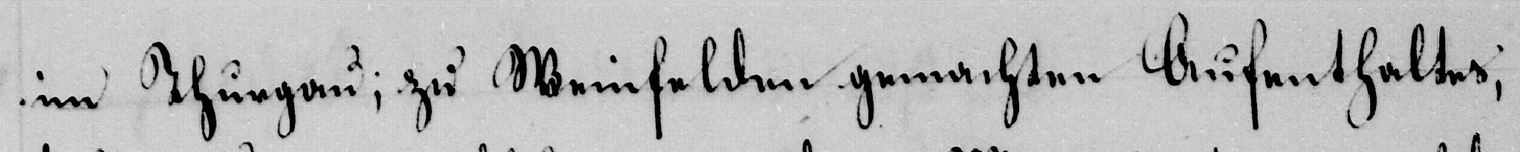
im Thurgau; zu Weinfelden gemachten Aufenthaltes;
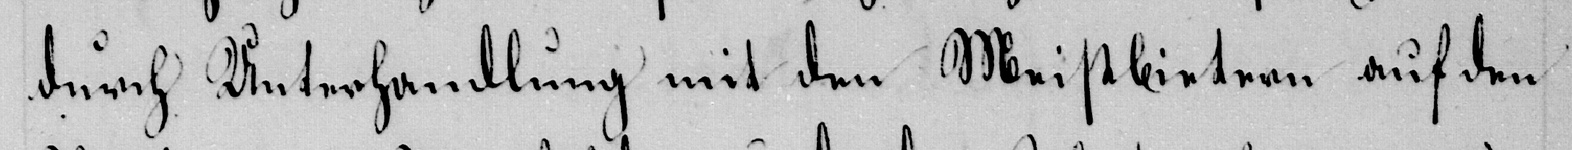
durch Unterhandlung mit den Meistbietern auf den
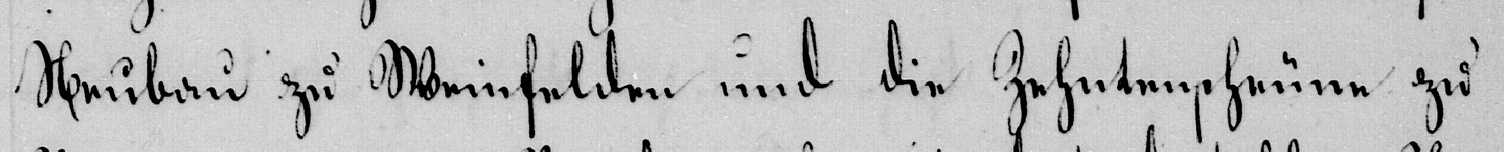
Neubau zu Weinfelden und die Zehntenscheune zu
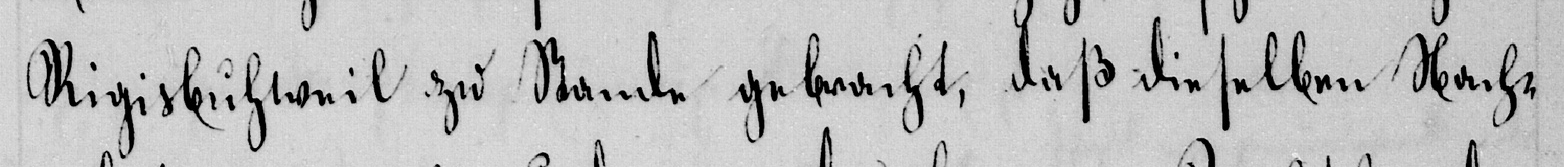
Rigisbuhweil zu Stande gebracht, daß dieselben Nach¬
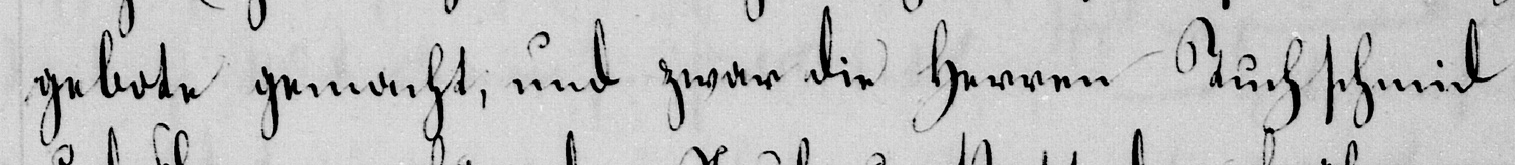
gebote gemacht, und zwar die Herrn Tuchschmid
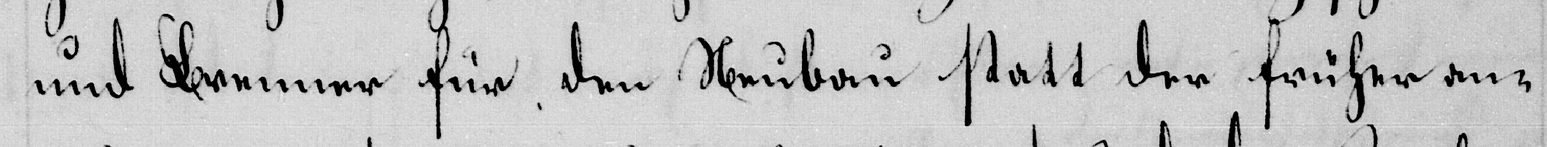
und Brunner für den Neubau statt der früher an¬
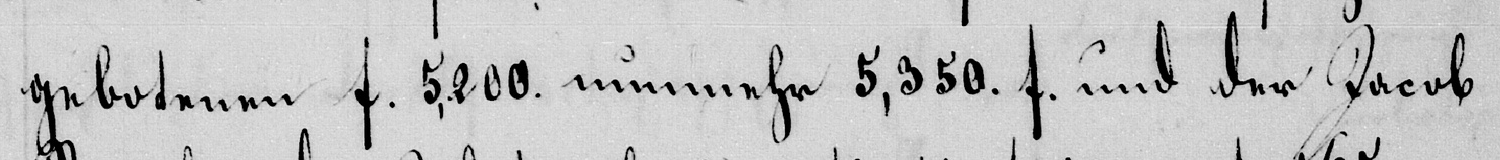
gebotenen f. 5,200. nunmehr 5,350. f. und der Jacob
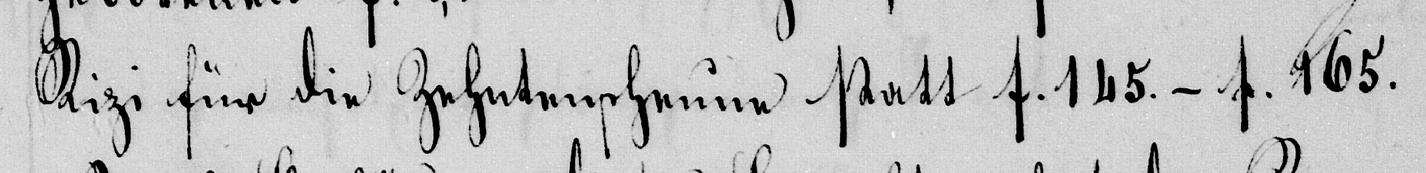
Rizi für die Zehntenscheune statt f. 145. – f. 165.
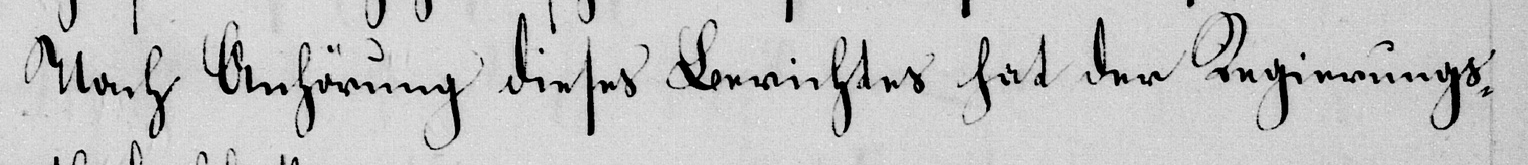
Nach Anhörung dieses Berichtes hat der Regierungs¬
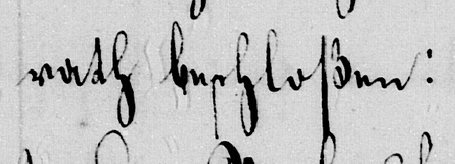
rath beschloßen:
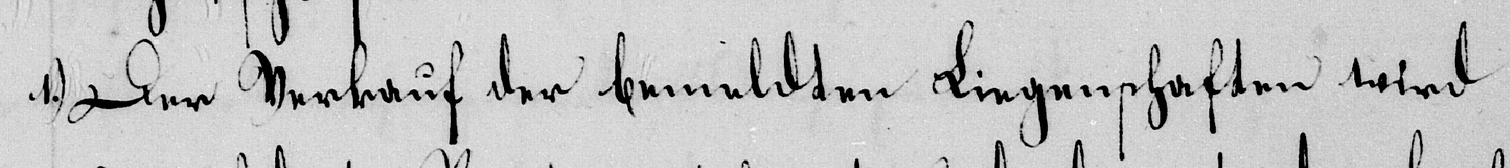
1.) Der Verkauf der bemeldeten Liegenschaften wird
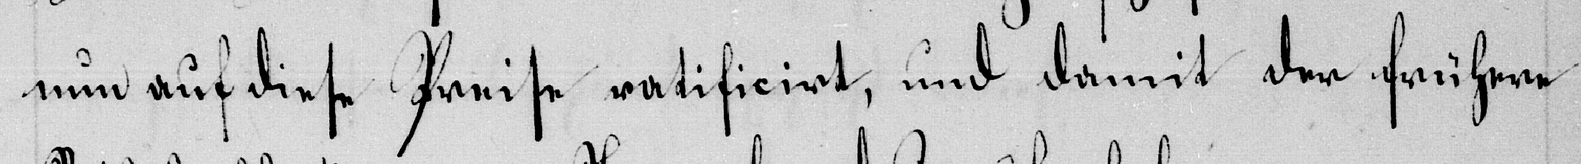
nun auf diese Preise ratificirt, und damit der frühere
